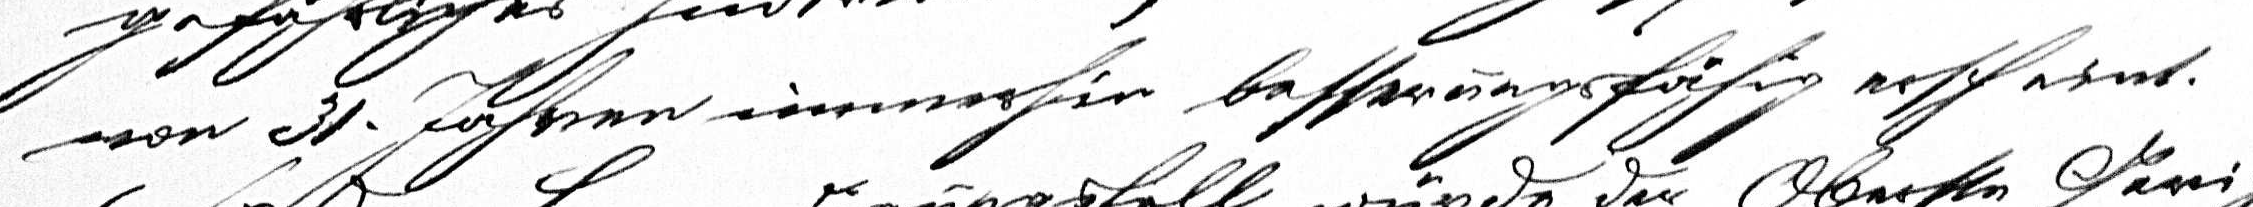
von 31. Jahren immerhin besserungsfähig erscheint.
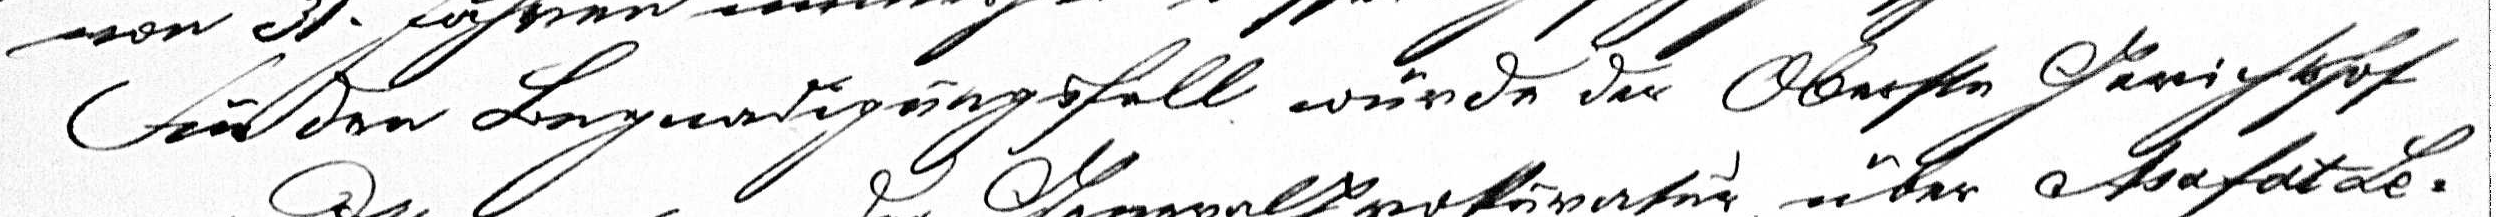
Für den Begnadigungsfall würde der Oberste Gerichtshof
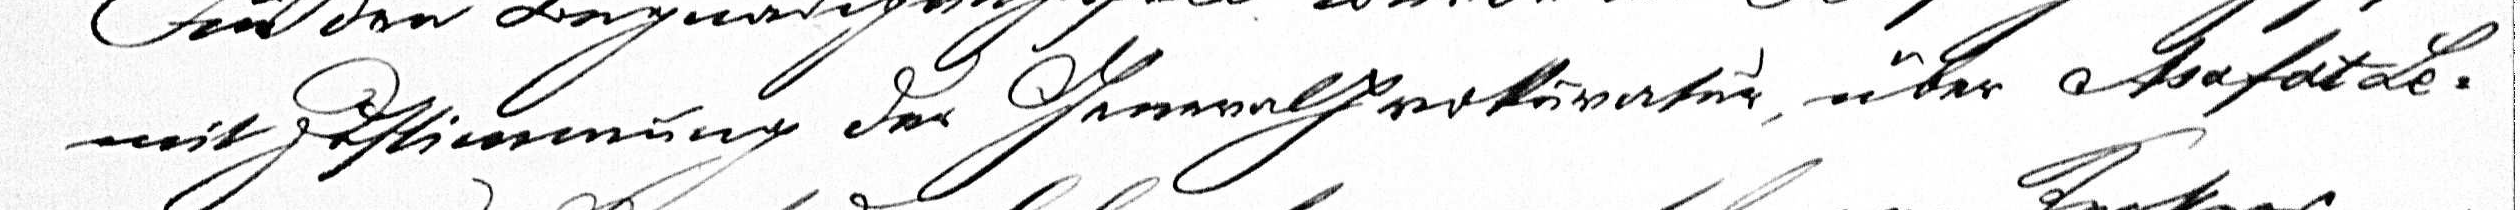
mit Zustimmung der Generlaprokuratur, über Asafat Le¬
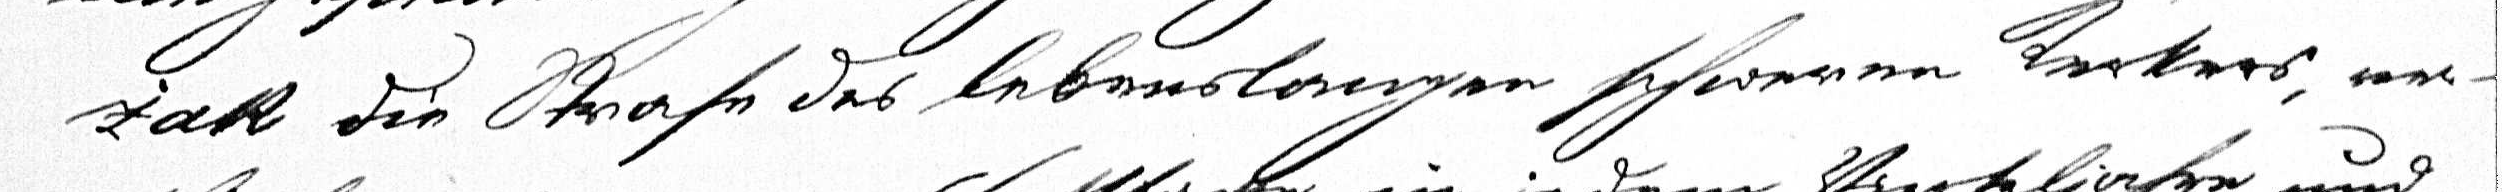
żak die Strafe des lebenslangen schweren Kerkers ver¬
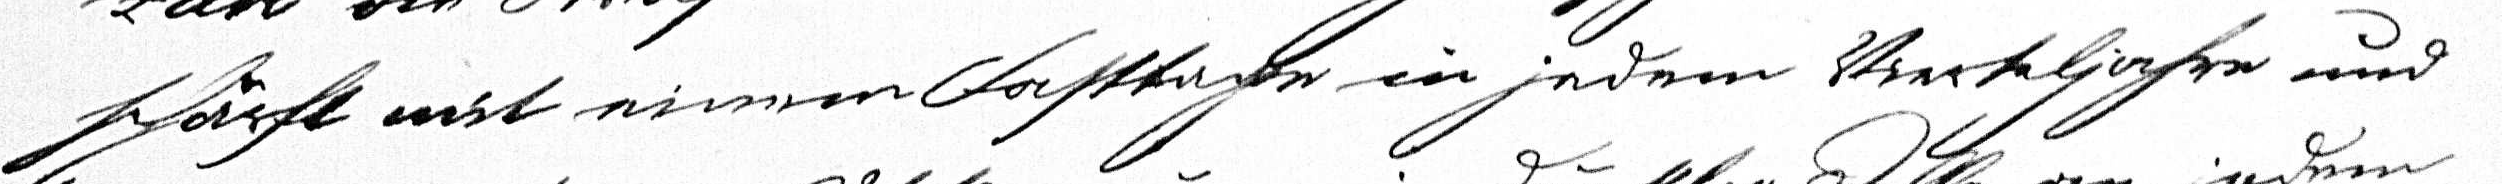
schärft mit einem Fasttage in jedem Vierteljahre und
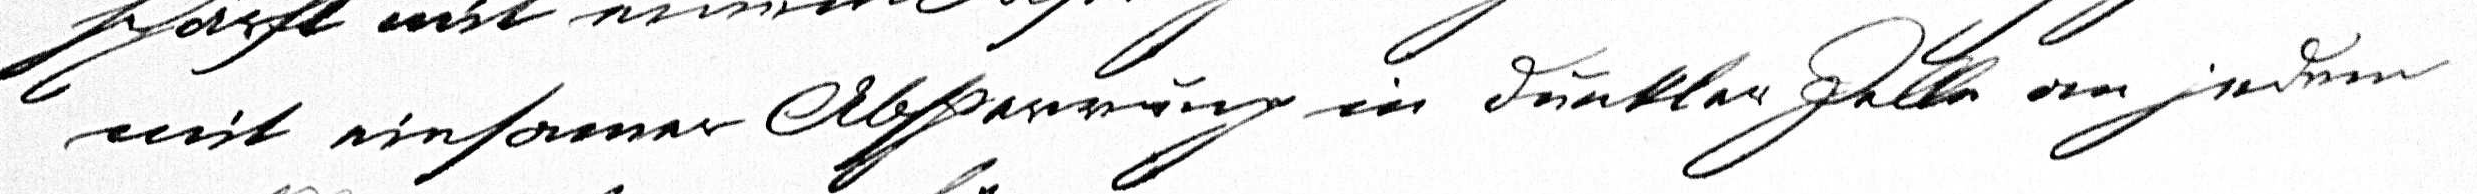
mit einsamer Absperrung in dunkler Zelle an jedem
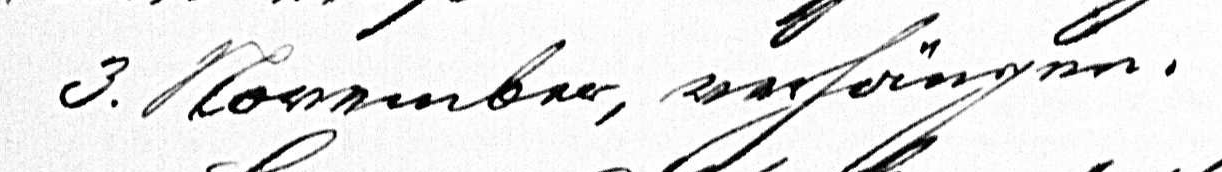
3. November, verhängen.
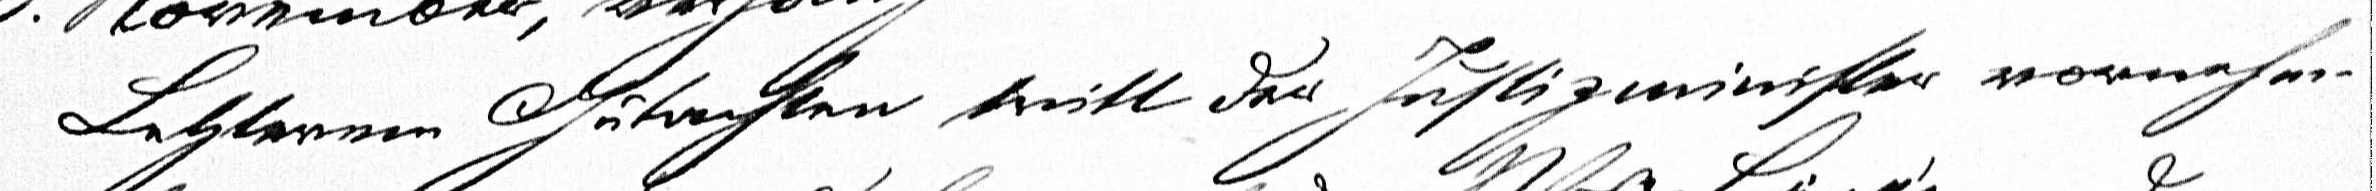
Letzteren Gutachten tritt der Justizminister vornehm¬
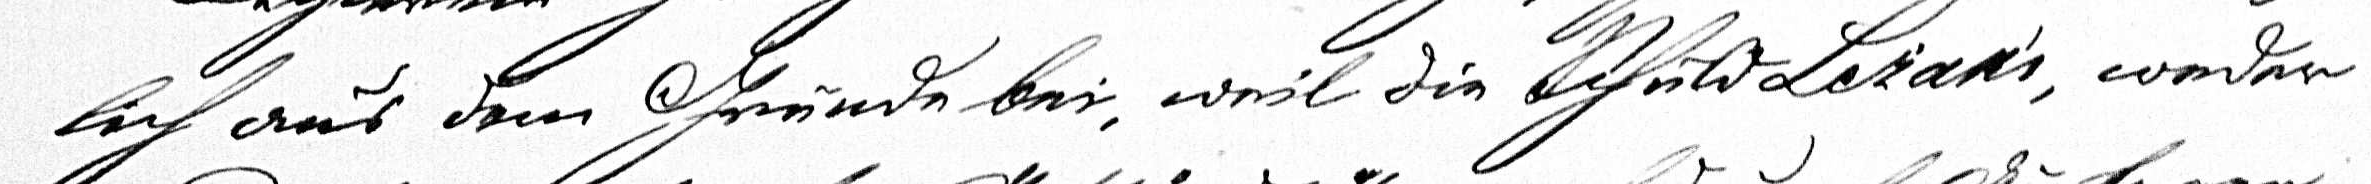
lich aus dem Grunde bei, weil die Schuld Leżaks, weder
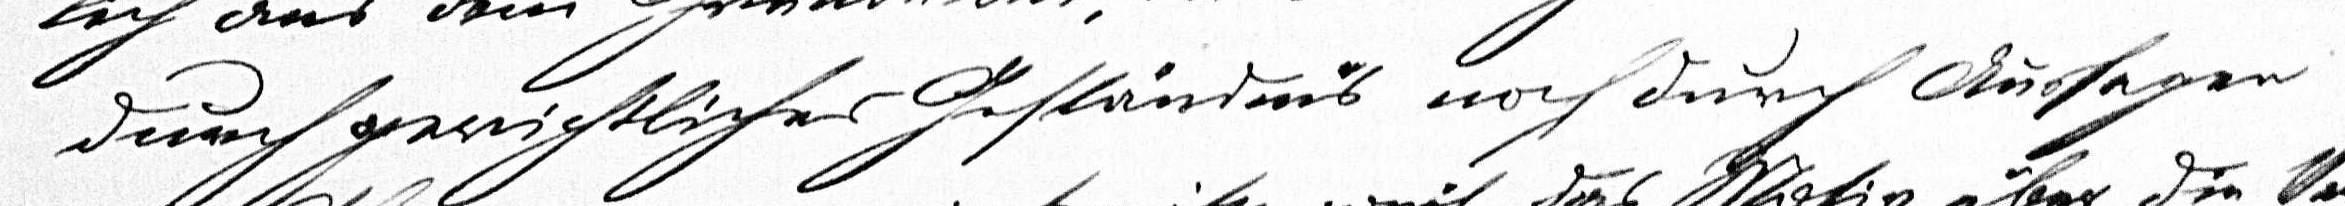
durch gerichtliches Geständnis noch durch Aussagen
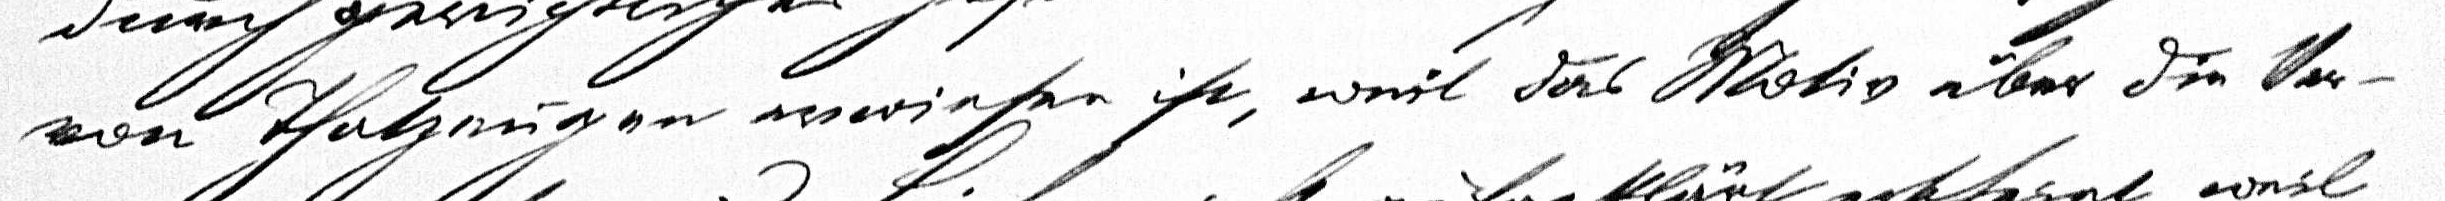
von Thatzeugen erwiesen ist, weil das Motiv über die Ver¬
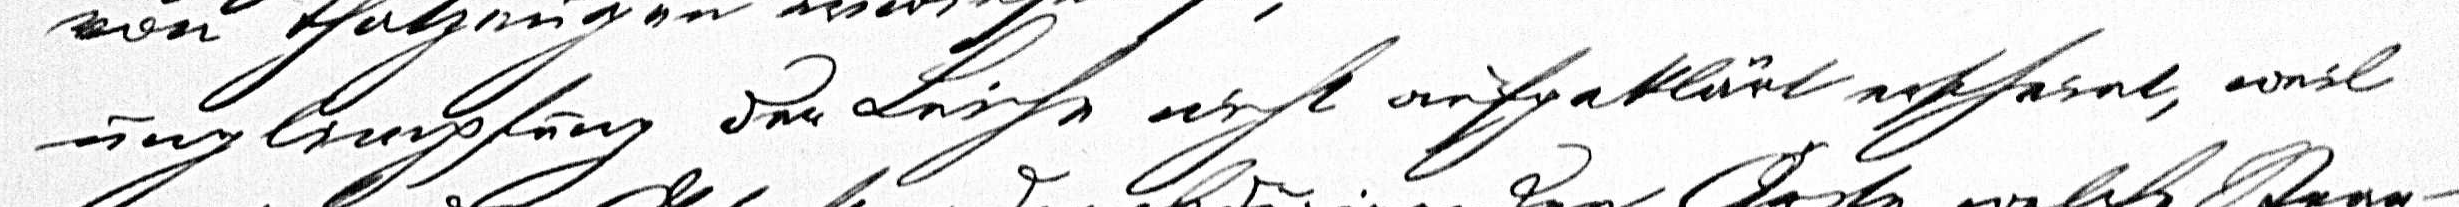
unglimpfung der Leiche nicht aufgeklärt erscheint, weil
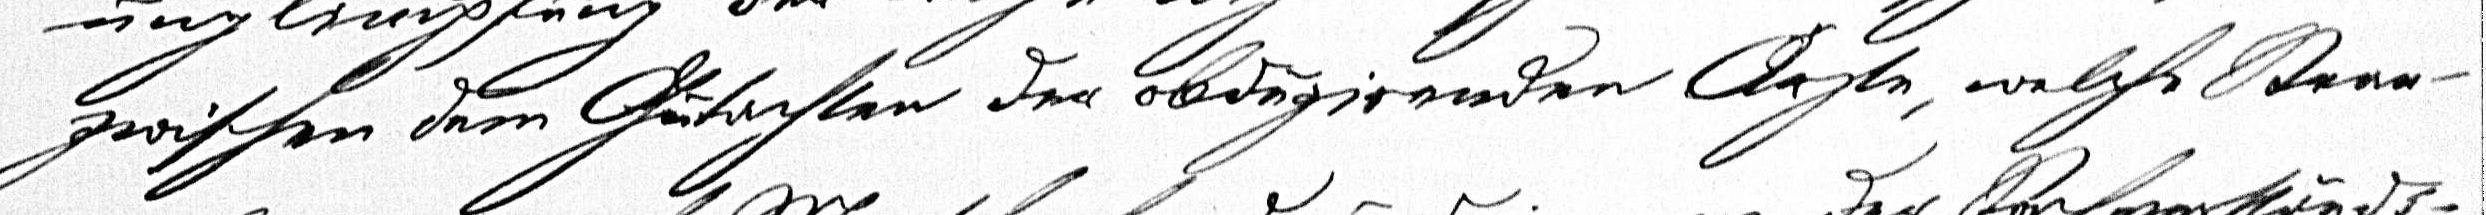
zwischen dem Gutachten der obduzirenden Ärzte, welche Stran¬
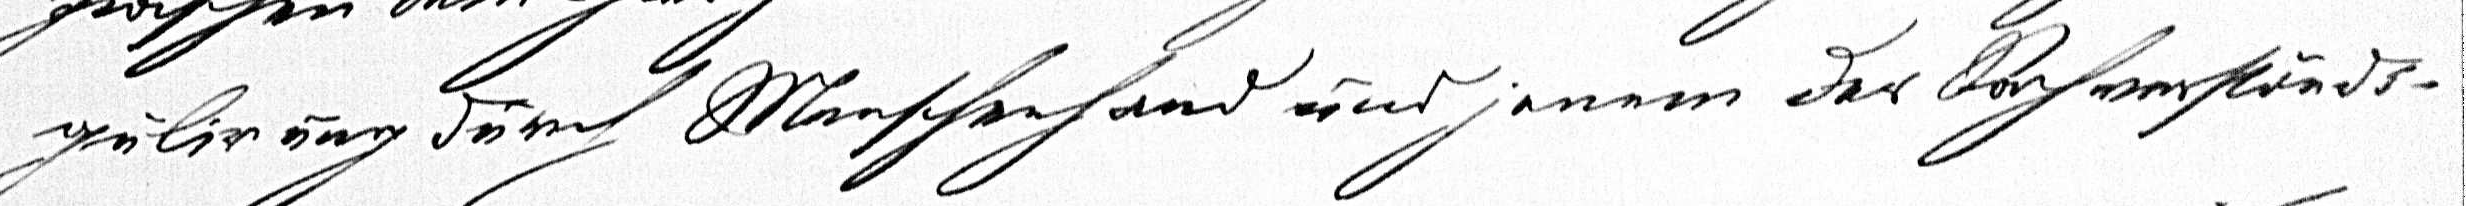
gulirung durch Menschenhand aus jenem der Sachverständi¬
